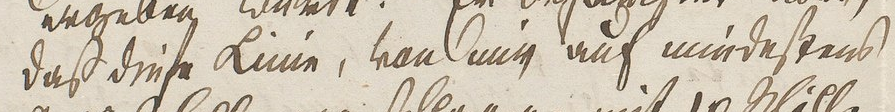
daß diese Linie, von mir auf mindestens
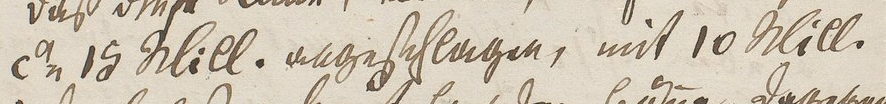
ca 15 Mill. angeschlagen, mit 10 Mill.
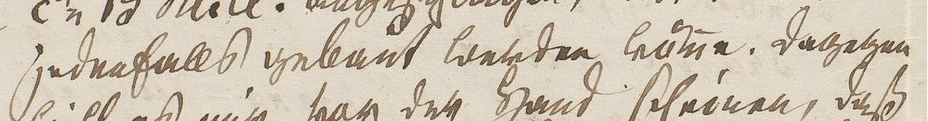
jedenfalls gebaut werden könne. Dagegen
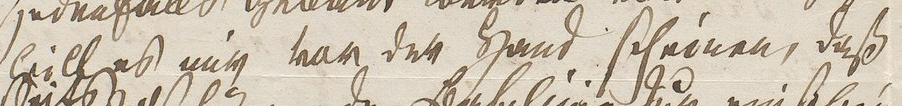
will es mir vor der Hand scheinen, daß
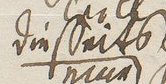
diesseits
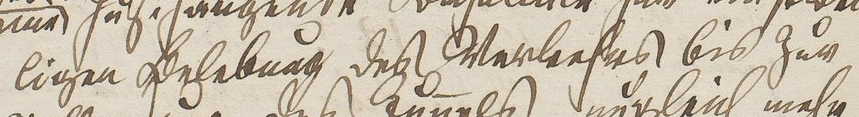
ligen Belebung des Verkehrs bis zur
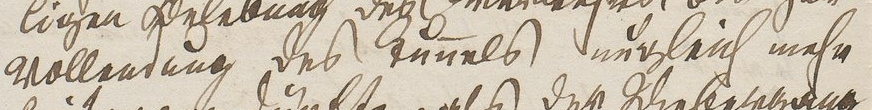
Vollendung des Tunnels ungleich mehr
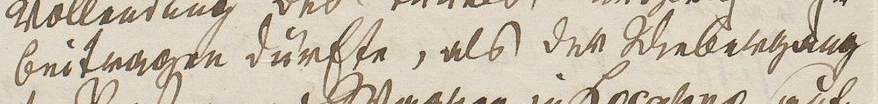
beitragen dürfte, als der Uebergang
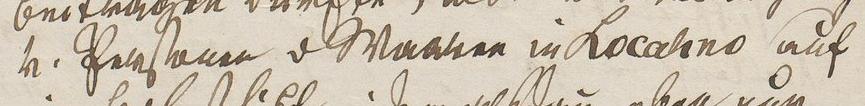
v. Personen & Waaren in Locarno auf
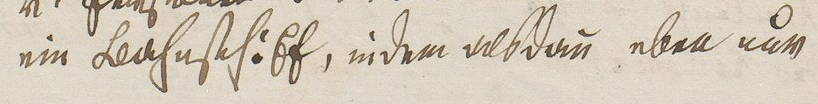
ein Bahnschiff, indem alsdann eben nur
